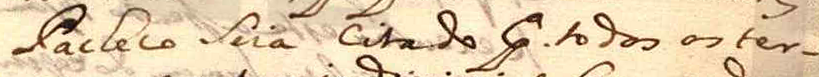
Pacheco seia citado p.a todos os ter
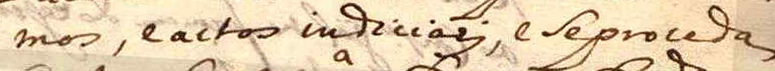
mos, e actos iudiciaes, e se proceda
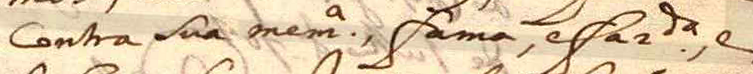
Contra sua mema., fama, e faz.da, e
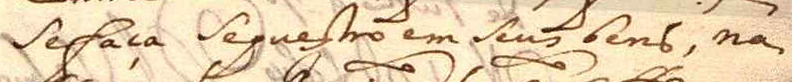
se faça sequestro em seus bens, na
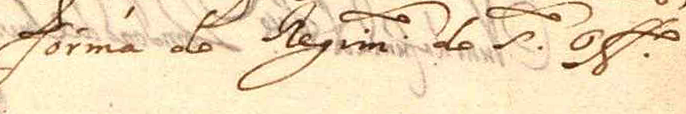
forma do Regim.to do s.to off.o
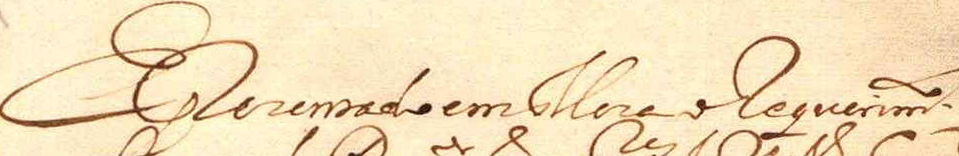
E pRezentado em Meza o Requerim.to
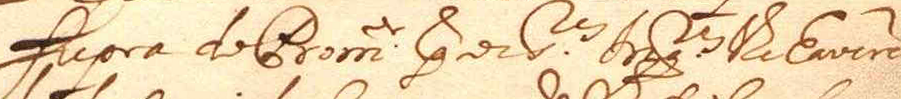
supra do Prom.or pa os s.res Inq.res lhe haverē
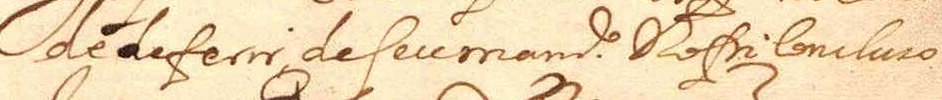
de deferir de seu mand.o lho foi Concluzo
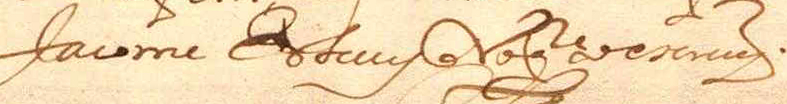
Jacome Esteues Nogra o escreuj.
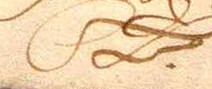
CL.o
